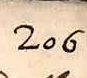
206
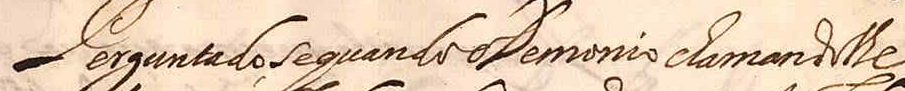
Perguntado se quando o Demonio chamandolhe
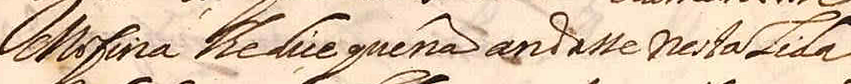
Mofina lhe dice que naõ andasse nesta Lida
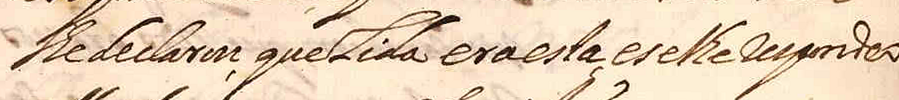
lhe declarou, que Lida era esta, e se lhe Respondeo
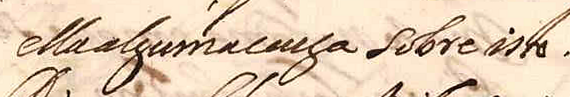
ella alguma couza sobre isto?
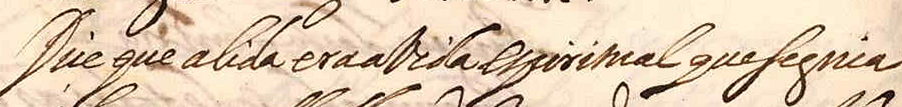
Dice que a lida era a Vida espiritual que seguia
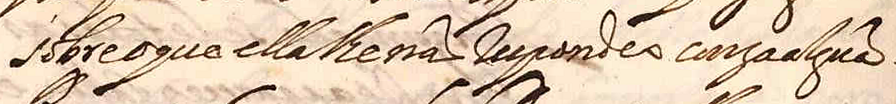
sobre o que ella lhe não Respondeo couza alguā
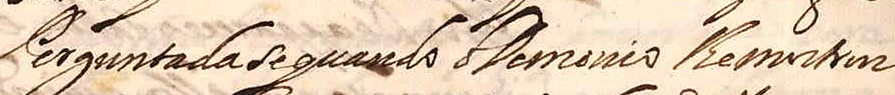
Perguntada se quando o Demonio lhe mostrou
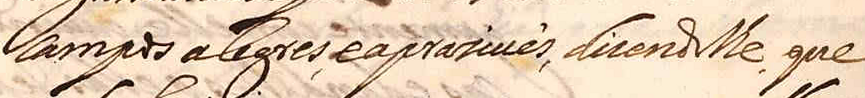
campos alegres, e apraziues, dizendolhe, que
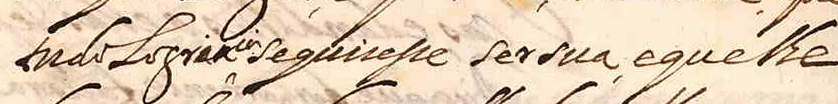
tudo Lograria se quizesse ser sua, e que lhe
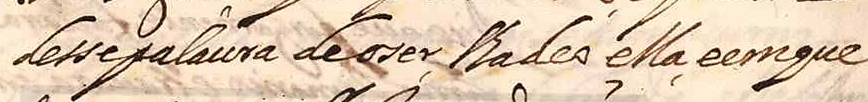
desse palaura de o ser, lha deo ella, e em que
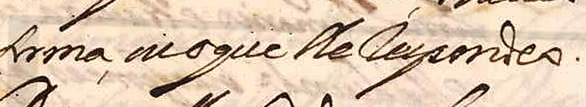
forma, ou o que lhe Respondeo?
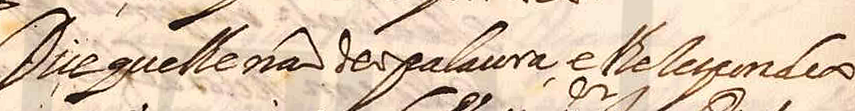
Dice que lhe não deo palaura, e lhe Respondeo
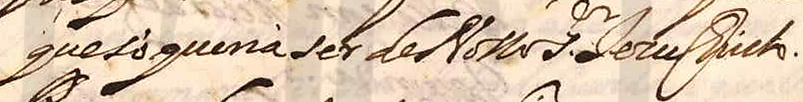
que só queria ser de Nosso s.or Iezu Christo.
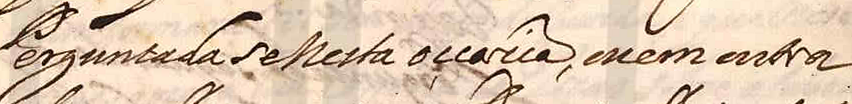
Perguntada se nesta occaziā, ou em outra
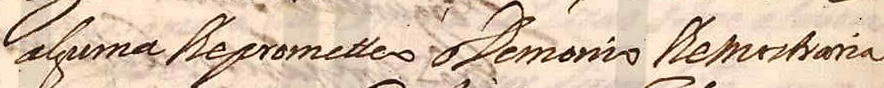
alguma lhe prometteo o Demonio lhe mostraria
